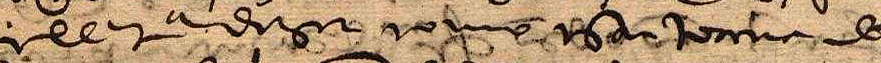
elle ta dizer como esta Joana de
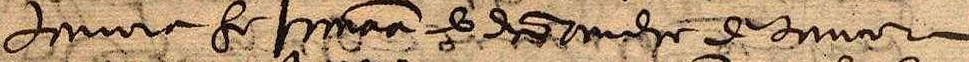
tauora he Jrmāa do dt̄o andre de tauora
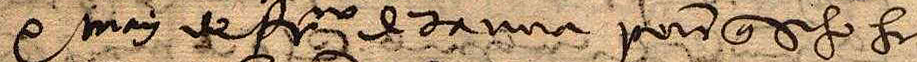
e may do frco de tauora porē q̄ se ho he
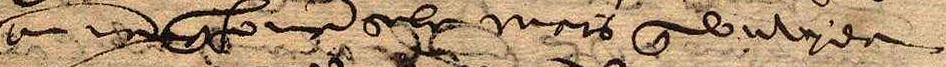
ou nā q̄ ho nā sabe mais q̄ douvyda
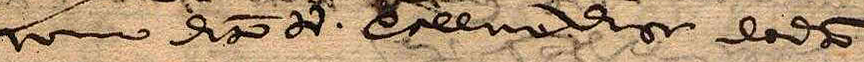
como dito tē. e all nō dise do dt̄o
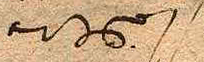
arto./
